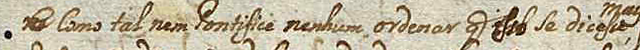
E Como tal nem Pontifice nenhum ordenar q̄ isso se dicesse
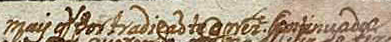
mais q̄ por tradiçaõ te o prez.te Continuada
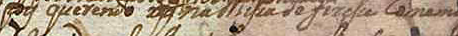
poq̄ querendo o q̄ na Missa se fizesse Comem
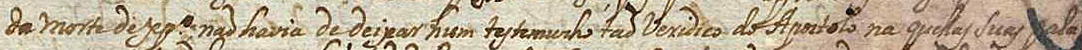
da morte de Xp.o naõ havia de deixar hum testemunho taõ Veridico do Apostolo naquellas Suas pala
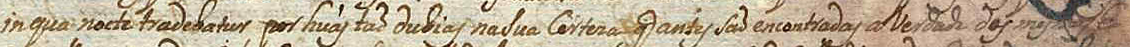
inqua nocte tradebatur, por huās taõ dubias na sua Certeza q̄ antes saõ encontradas a Verdade dos mesmos E
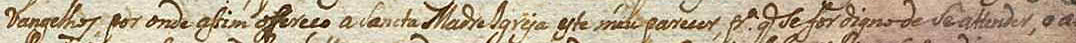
vangelhos por onde assim ofereço a Santa Madre Igreja este meu parecer, p.a q̄ se for digno de se attender o a
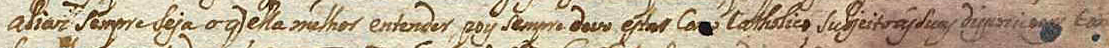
aliaz sempre Seja o q̄ ella melhor entender pois sempre devo estar Co_o Catholico sujeito as suas dispozicoens __
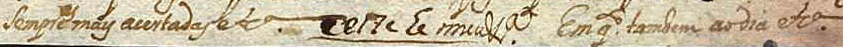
sempre mais acertadas etc.a E este he meu etc.a Emq̄to tambem ao dia etc.a
